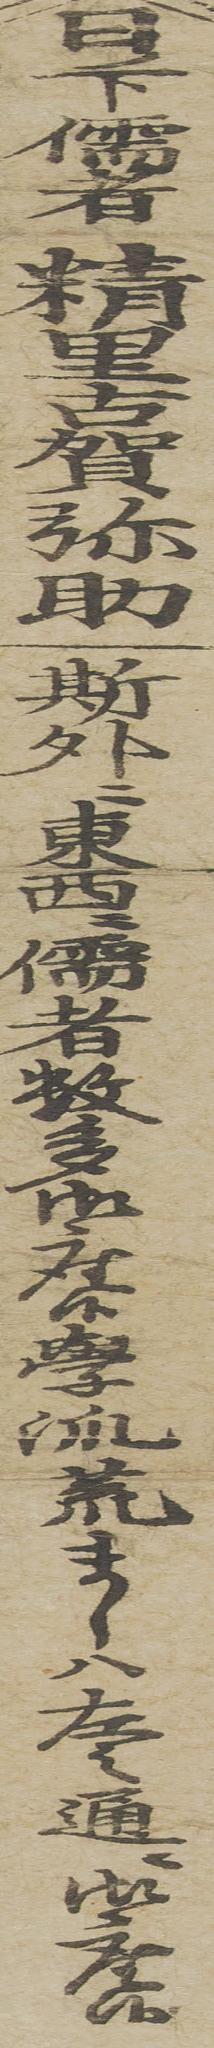日ノ下儒者精里古賀弥助斯外ニ東西ニ儒者数多御座候学派荒ましハ左之通ニ御座候
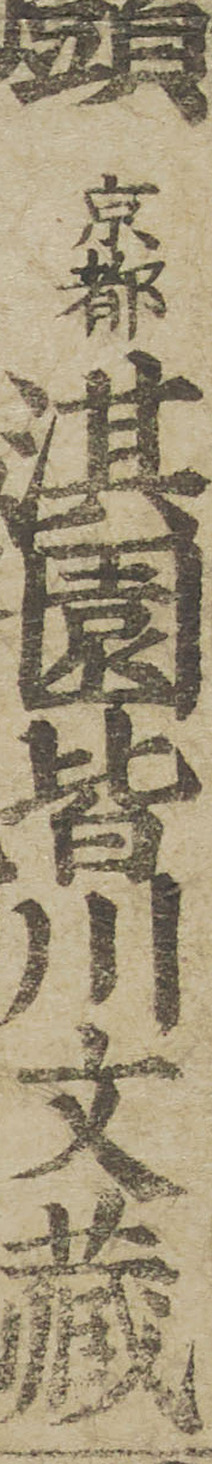前頭京都淇園皆川文蔵
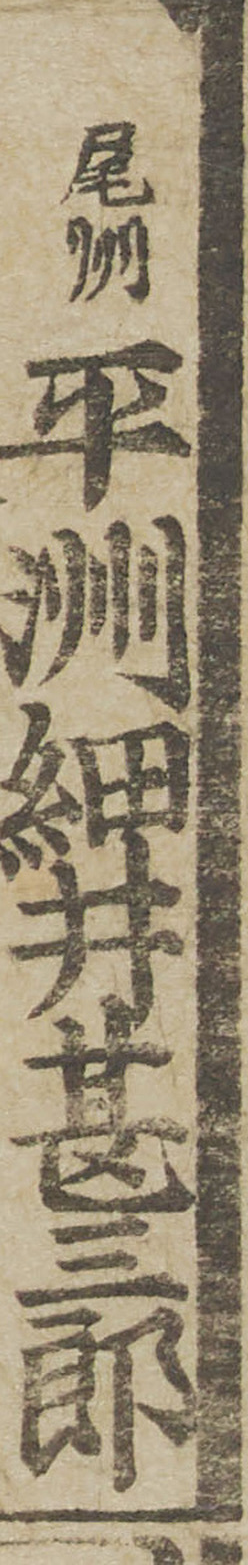同尾州平洲細井甚三郎
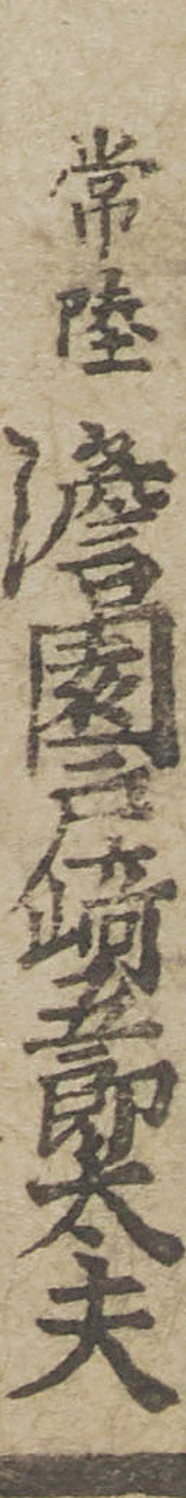同常陸澹園戸崎五郎太夫
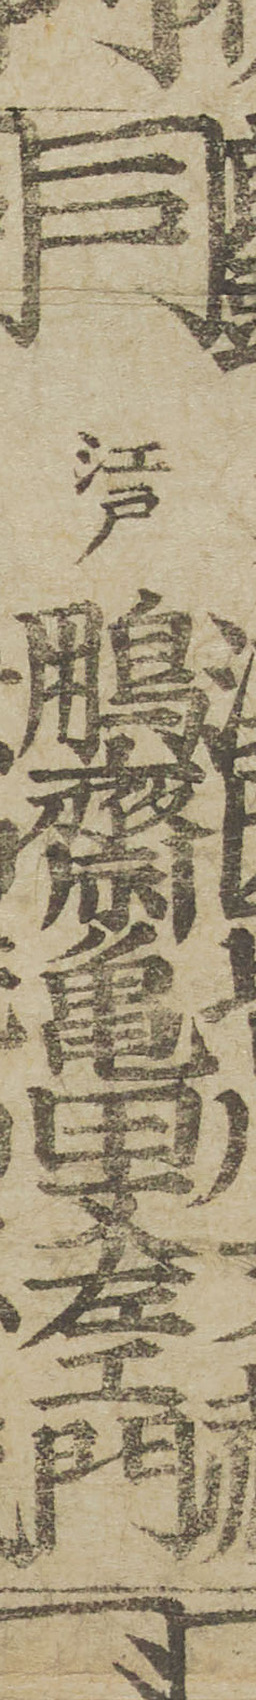同江戸鵬斎亀田文左エ門
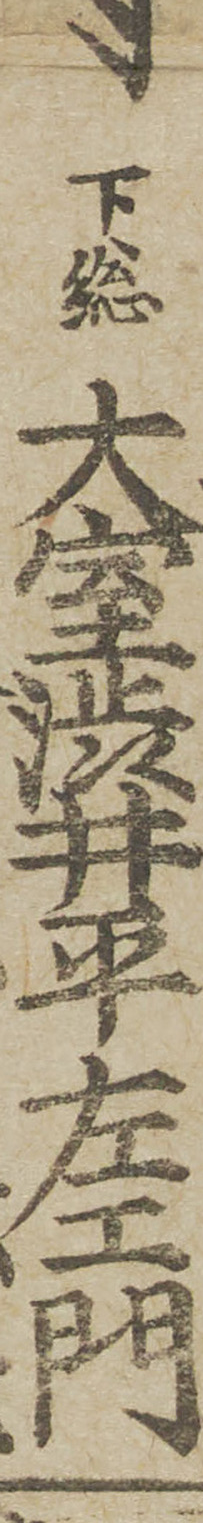同下総大室渋井平左エ門
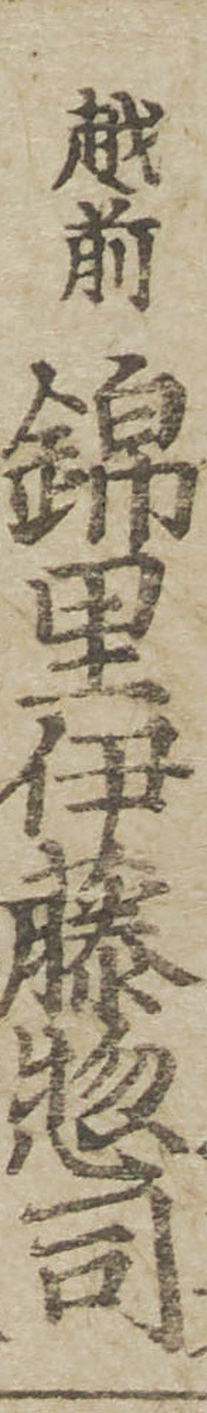同越前錦里伊藤惣司
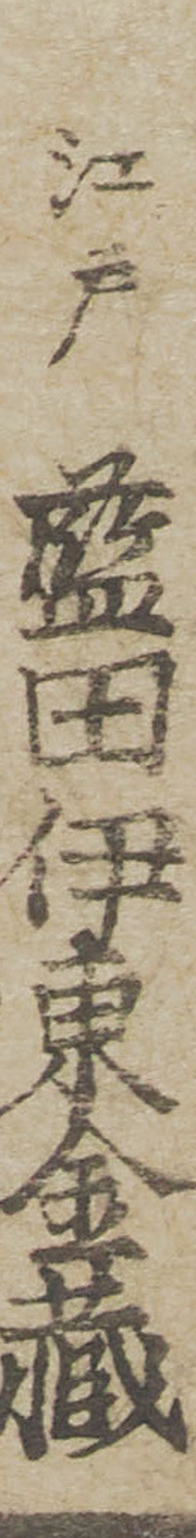同江戸藍田伊東金蔵
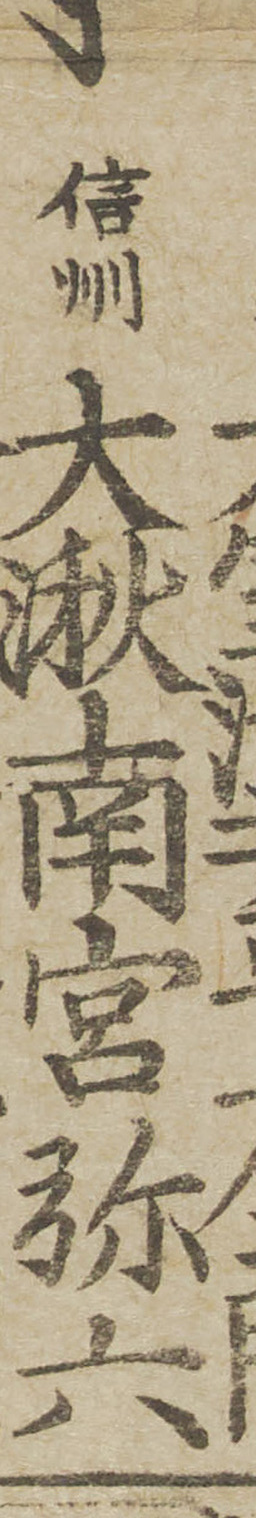同信州大湫南宮弥六
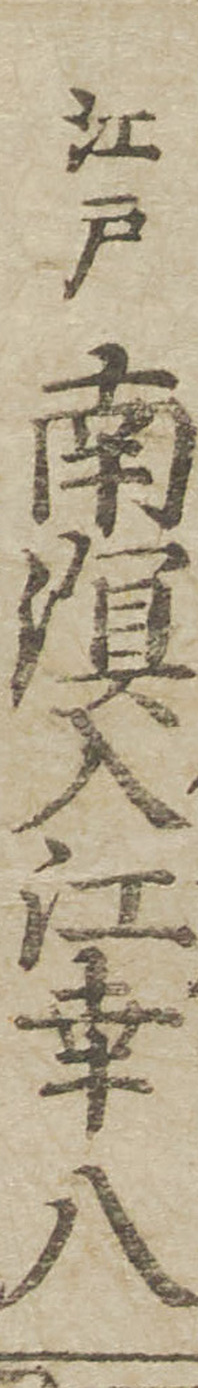同江戸南溟入江幸八
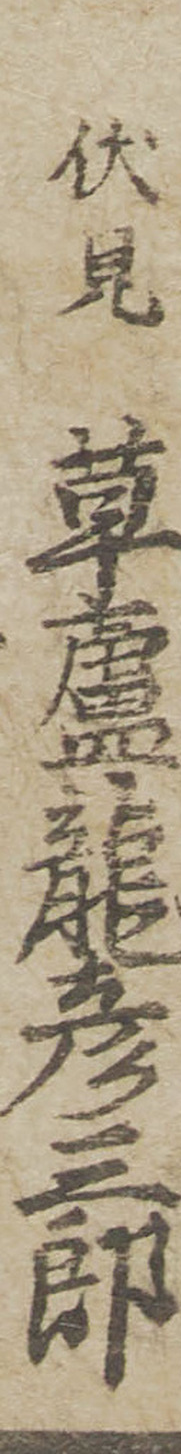同伏見草廬龍彦三郎
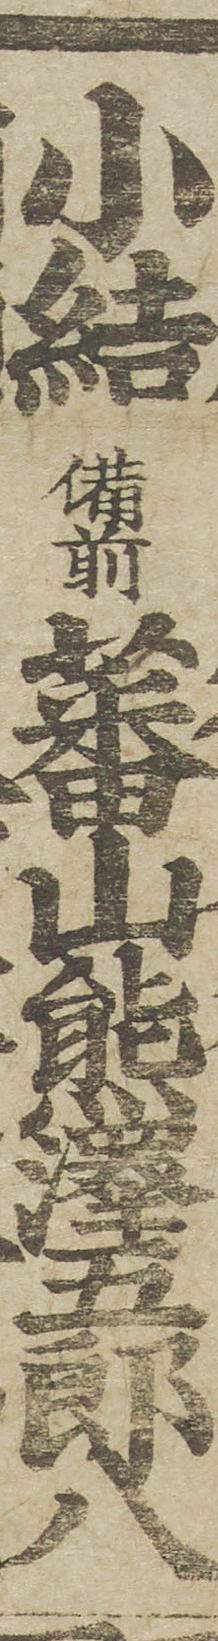小結備前蕃山熊澤五郎八
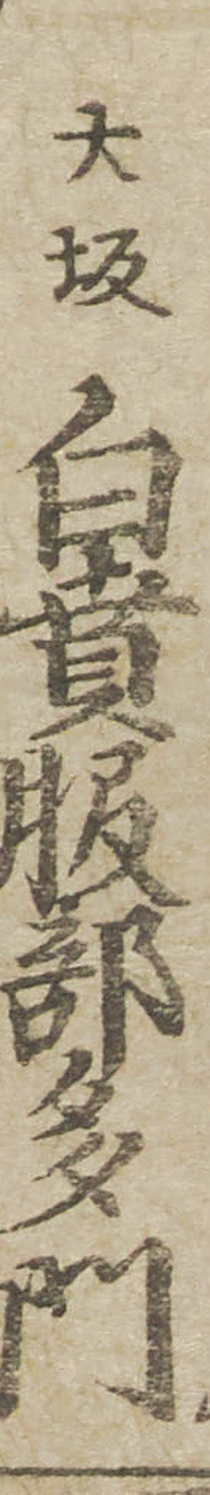同大坂白賁服部多門
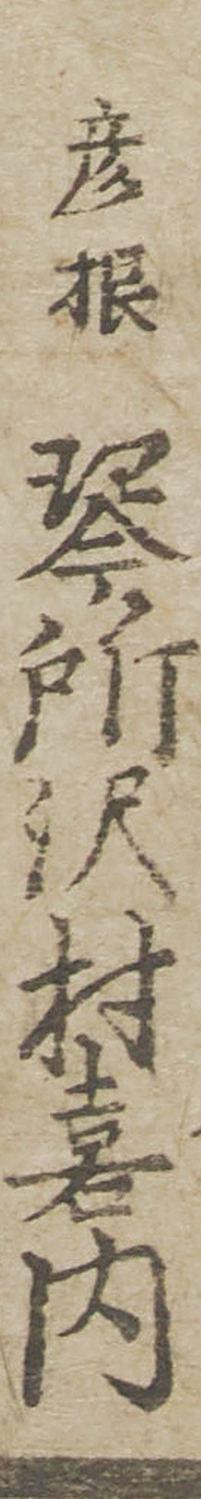同彦根琴所沢村喜内
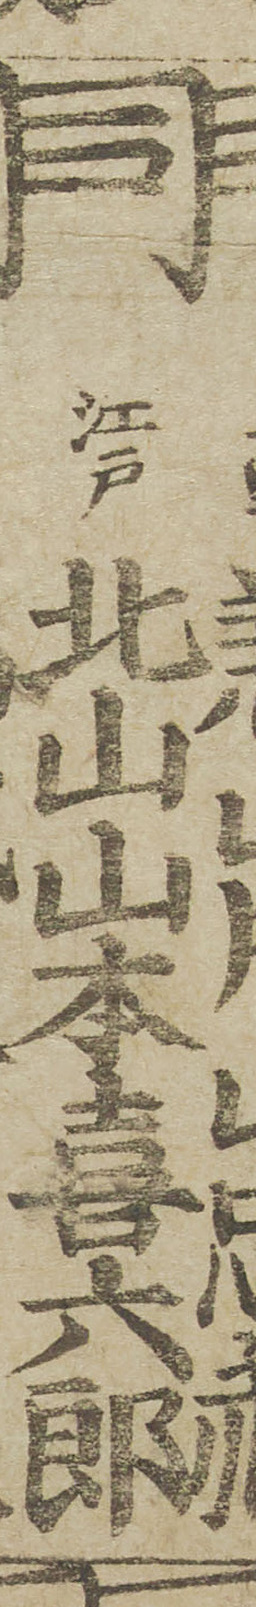同江戸北山山本喜六郎
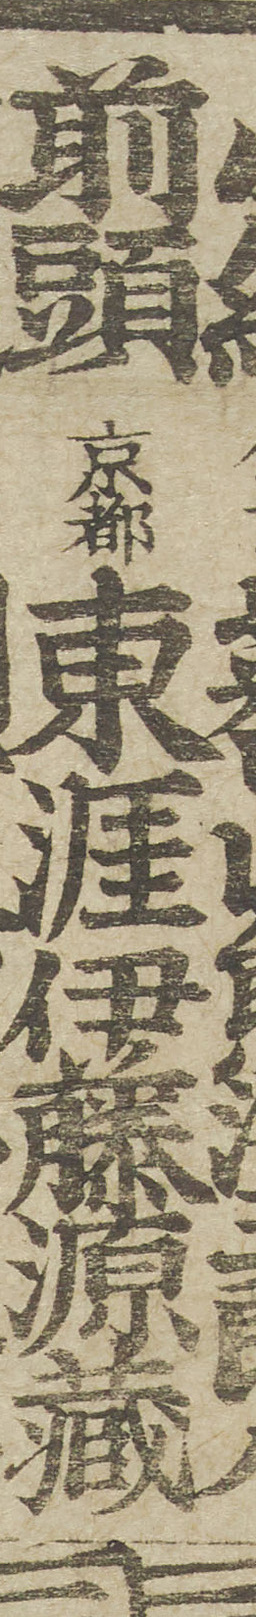前頭京都東涯伊藤源蔵
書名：儒者競
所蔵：東京大学総合図書館 General Library in the University of Tokyo, JAPAN
